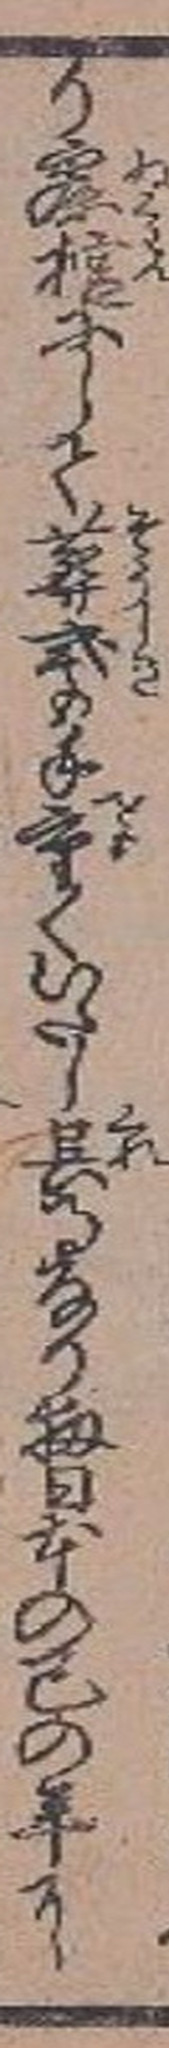り寝棺にして葬式も手重くいたし呉るなり扨日本の己の年に
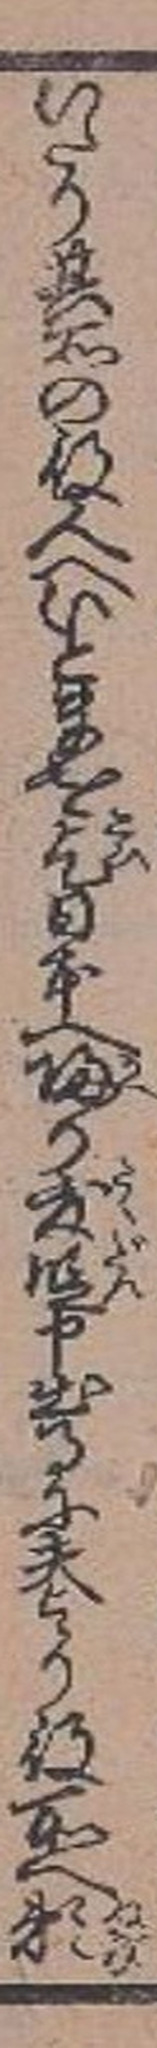いたり其所の役人へいとまを乞日本へ帰り度段申出るに夫より役所へ頼

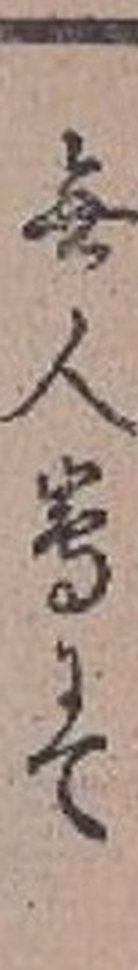無人嶋にて
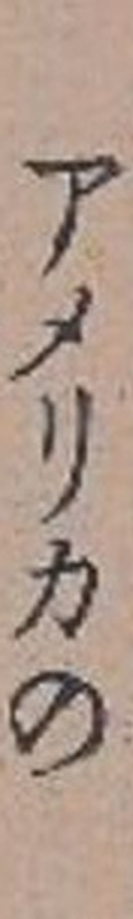アメリカの
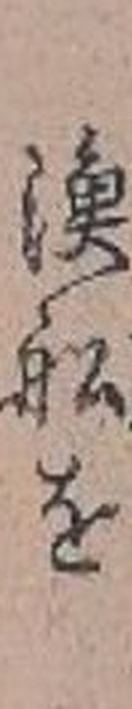漁船を
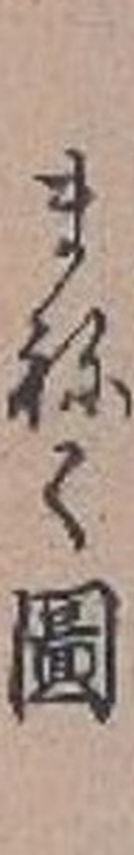まねく図

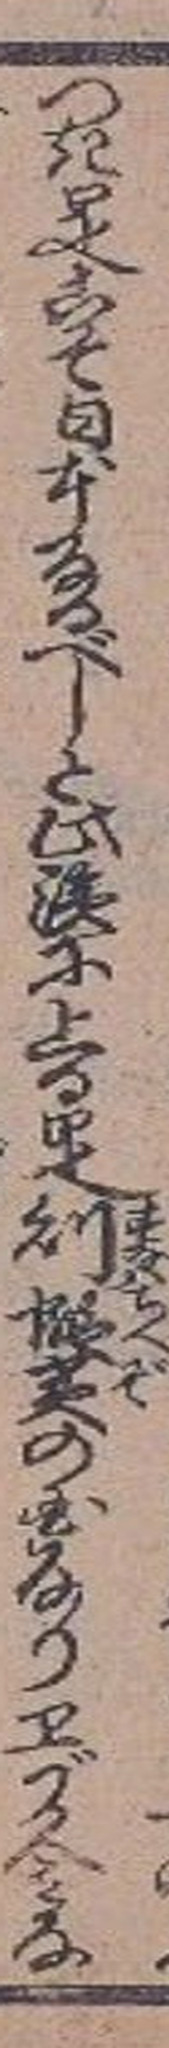つき是こそ日本なるべしと此湊に上る是則蝦夷の国なりヱブ人みな
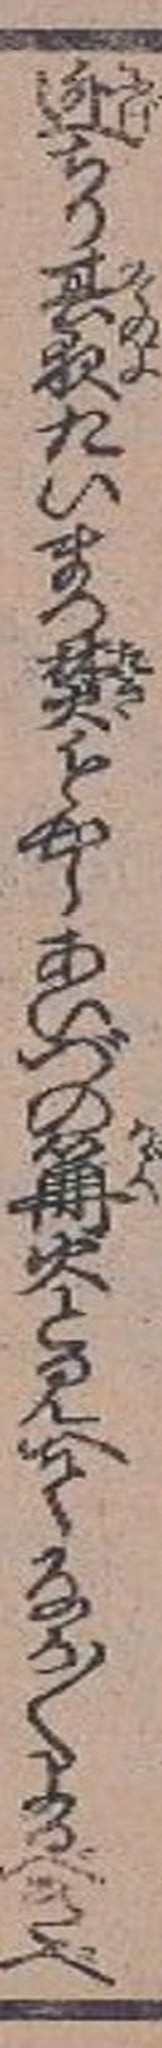逃ちり其夜たいまつ焚もやしあいづの篝火と見へてなか〳〵よるべきべ
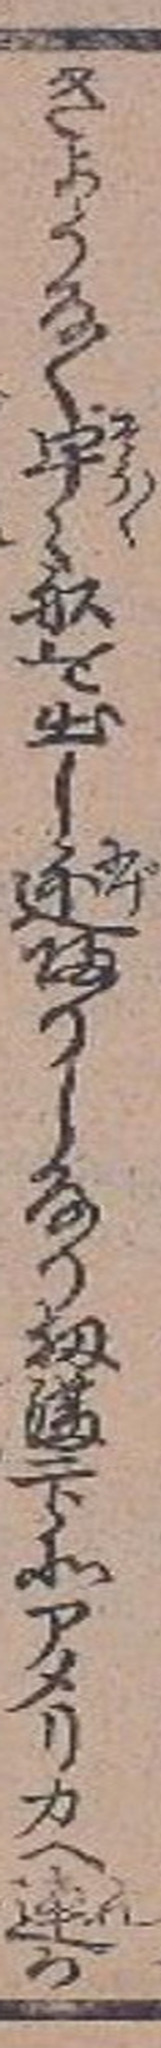きようなく早々船を出し逃帰りしなり扨満二郎北アメリカへ連か
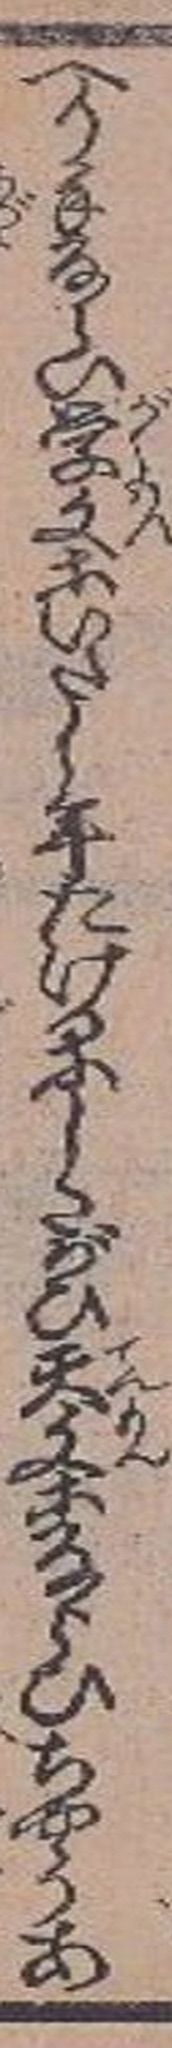へり手ならい学文等いたし年たけるにしたがひ天文等ならひちやうあ
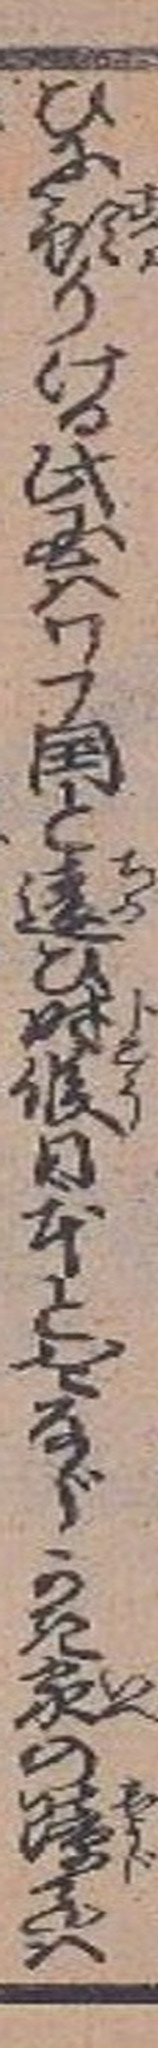ひに預りける此国はワフ国と違ひ時候日本とをなじかき？家の障子は
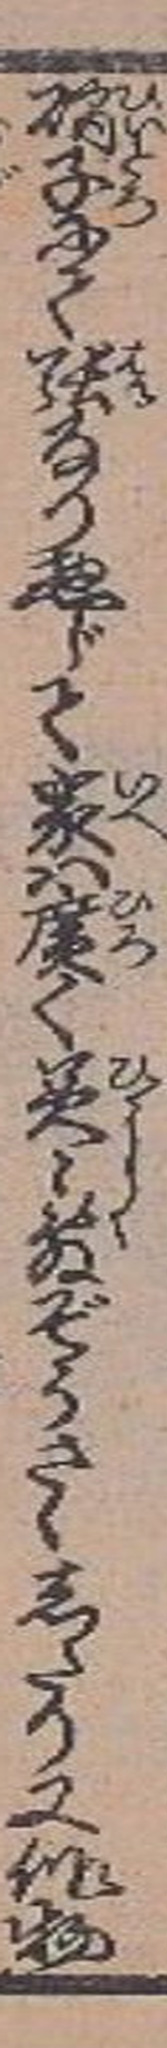硝子にて張なり惣じて家は広く美々敷ぞうさくしたり又作物
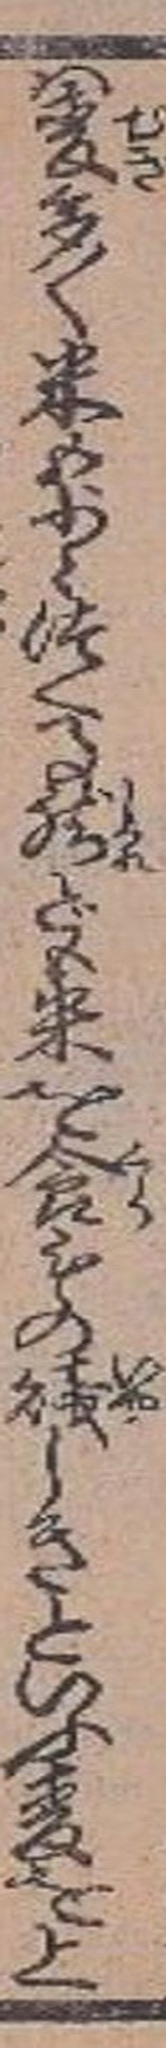は麦多く米も少々つくる然ども米を食もの賎しきといふ麦を上
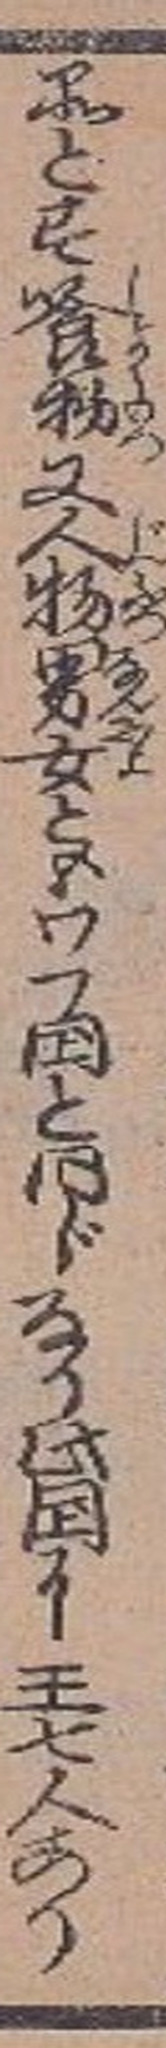品とす喰物又人物男女ともワフ国と同じなり此国に王七人あり
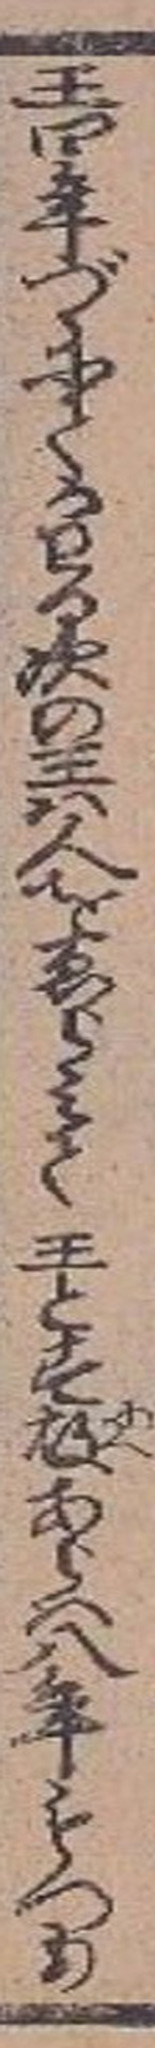王四年づゝにてかわる次の王は人をゑらみて王とす故あらは八年もつも
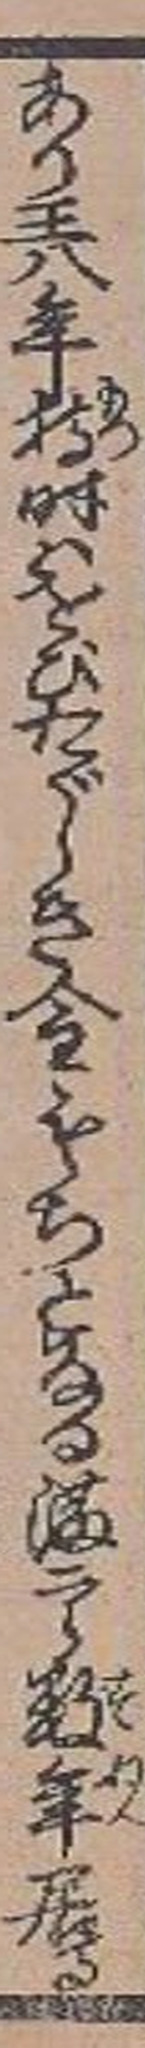あり王八年持時はをびたゞしき金もちとなる万二郎数年居る
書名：満次郎漂流記
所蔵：University of the Ryukyus Library
